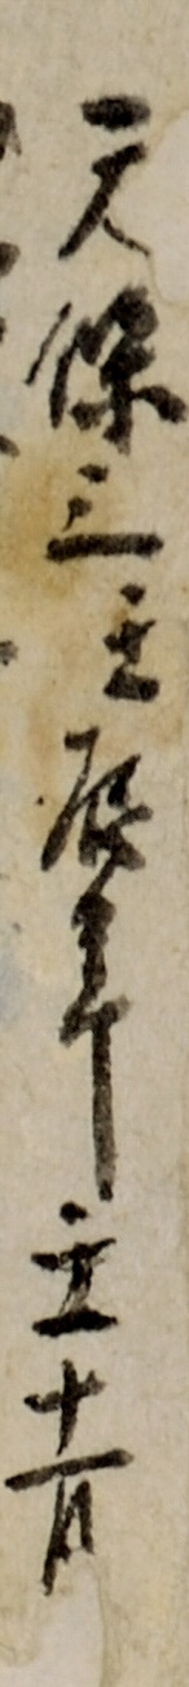天保三壬辰年閏十一月
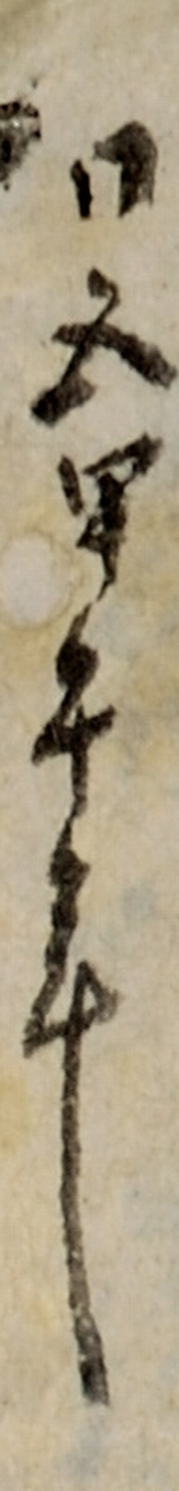同五甲午年
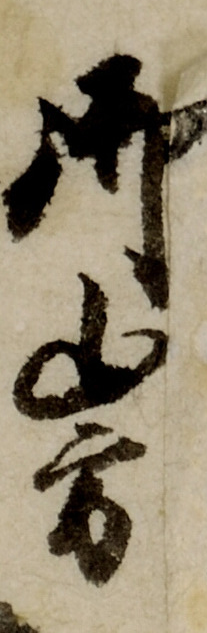御山方
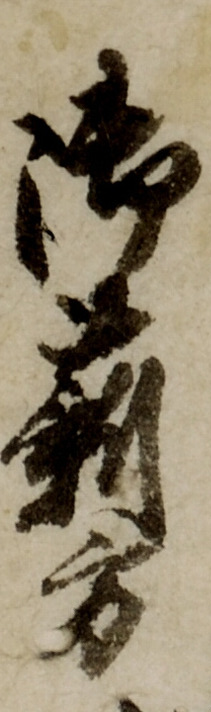御山方
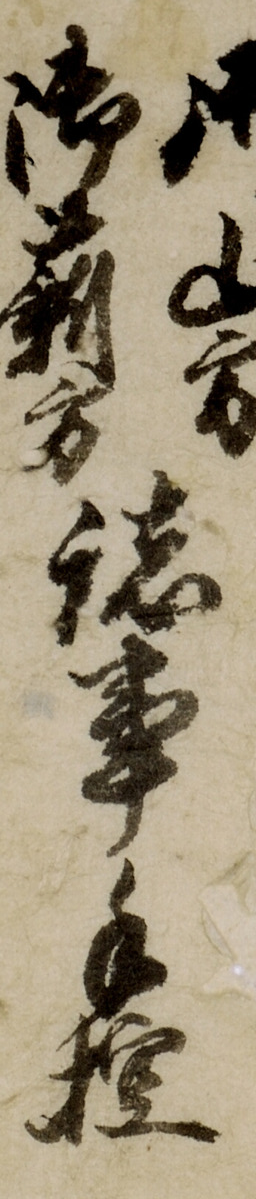御薪方諸事手控
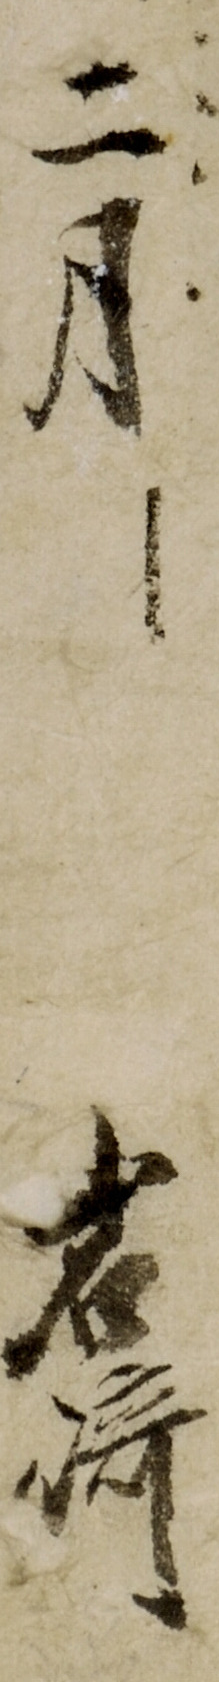二月岩崎
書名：御山方御薪方諸事手控
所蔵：伊那市立高遠町図書館・合同会社AMANE
